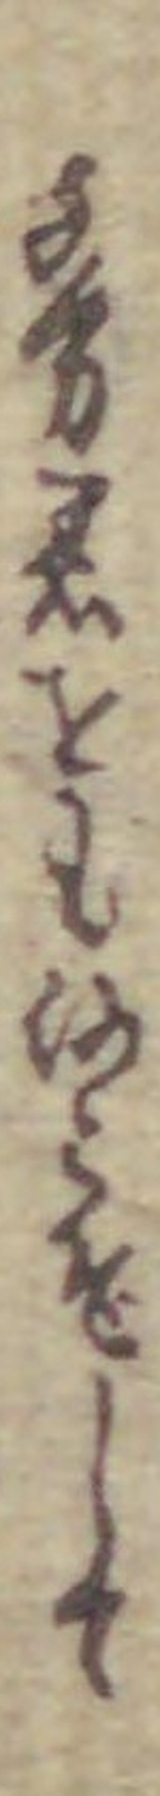千万君をも何とぞして
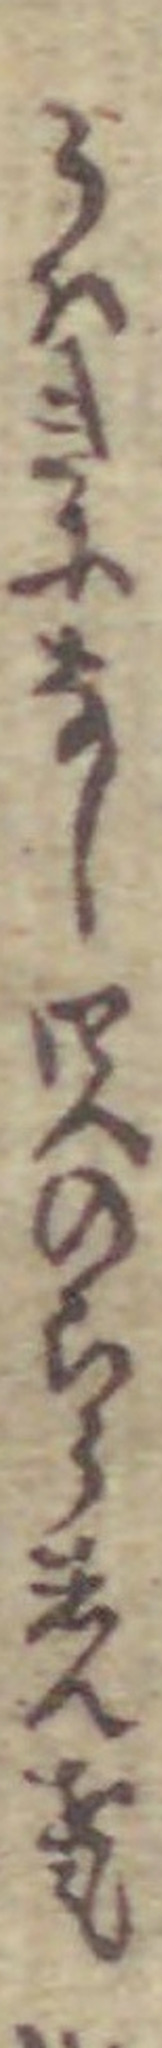うはきになし四人のらうしんをも
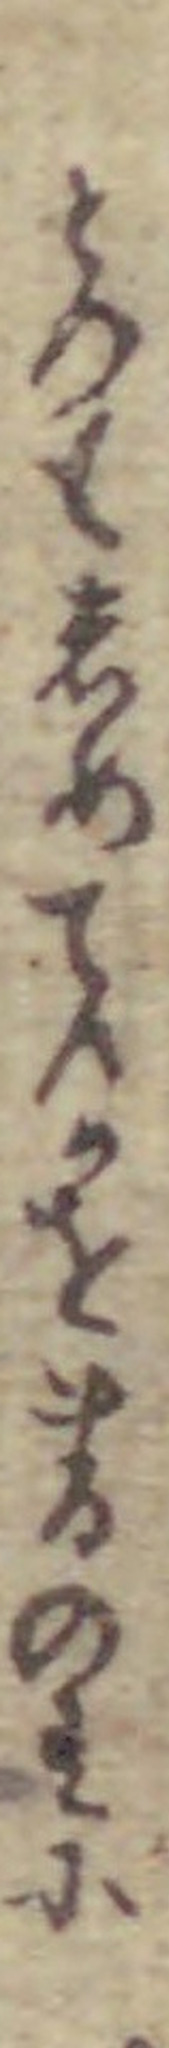とつてしめてんかをまるのみに
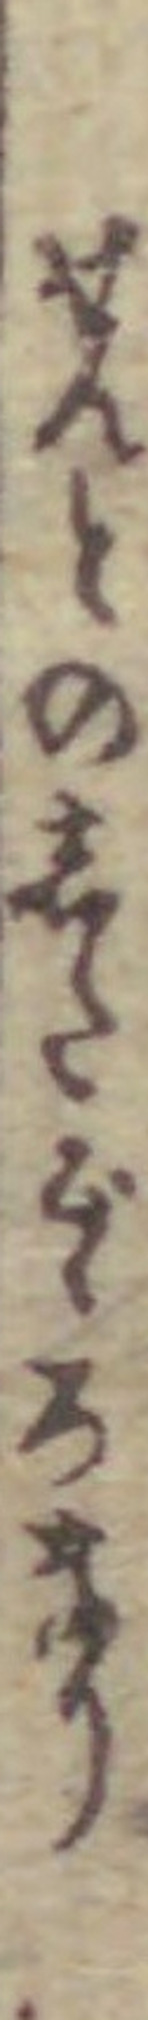せんとのしたごゝろなり
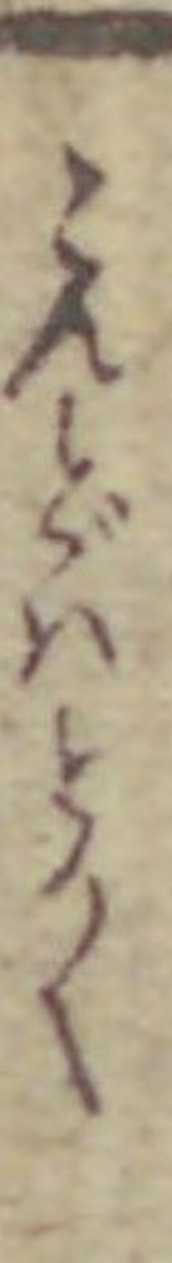こんどはとう〳〵
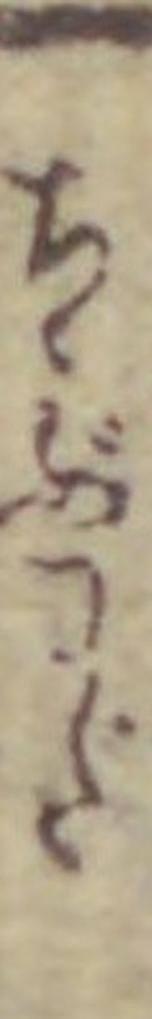ちゝぶわだ
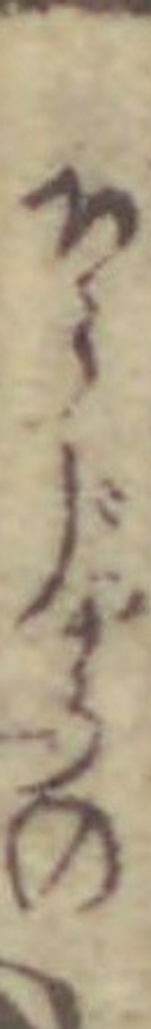ほうじやうの
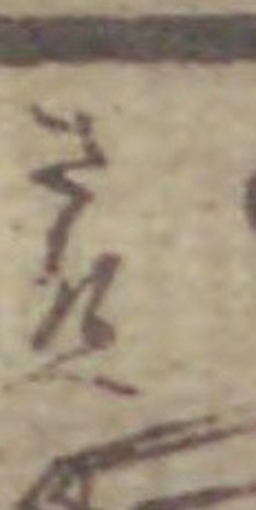さけへ
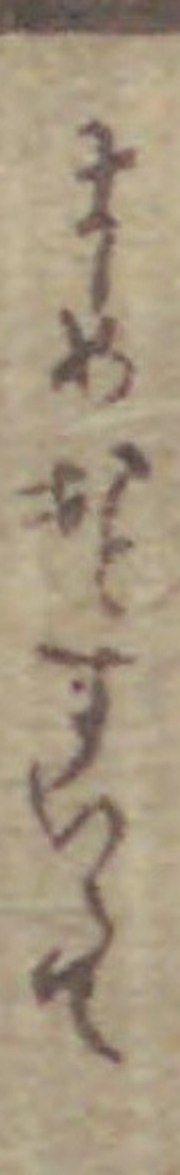すゝめおとすいゝて
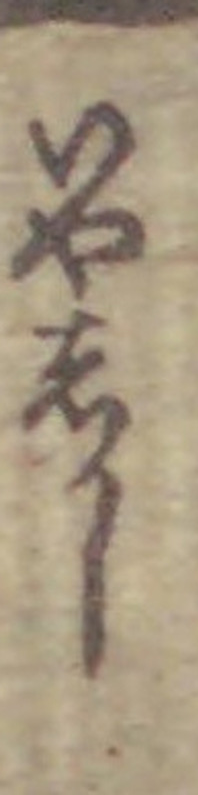いやしかし
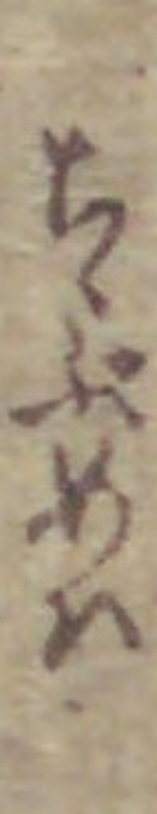ちゝぶめは
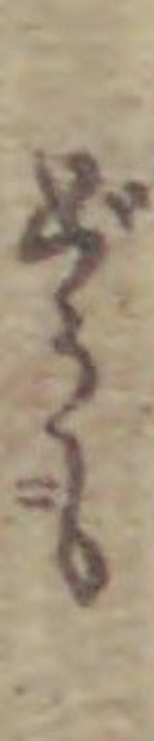どうも
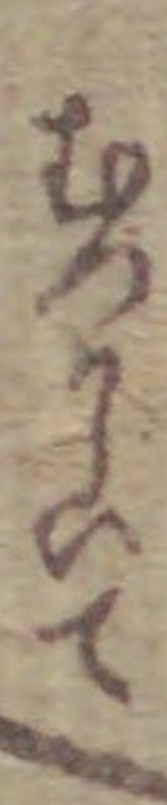むつかしいて

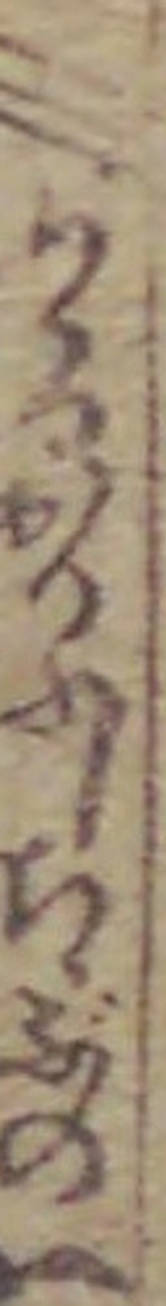かゝるおりふしちゝぶの
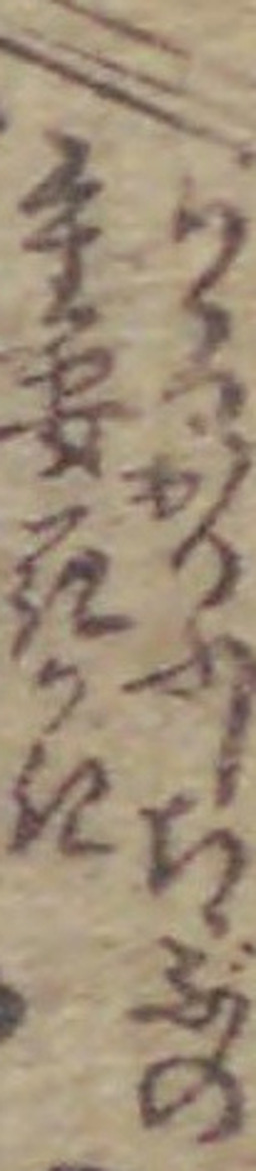重安花かき
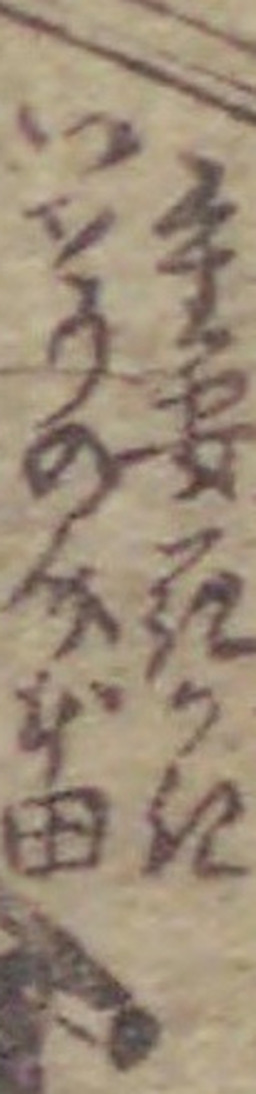いをりの介本田
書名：鎌倉山紅葉浮名
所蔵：国立国会図書館 National Diet Library, JAPAN
